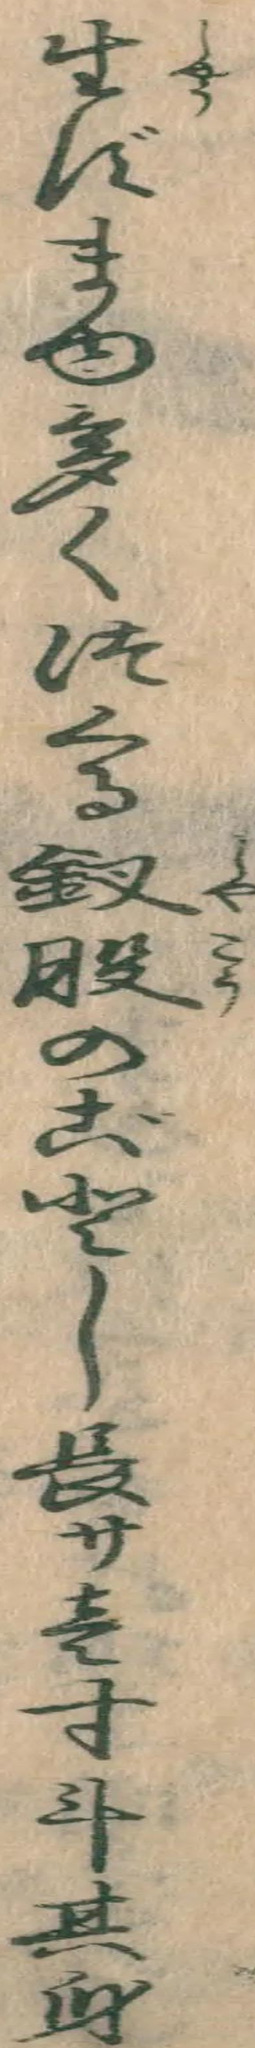生ずまゆ多くつくる釵股のごとし長さ壱寸斗其身
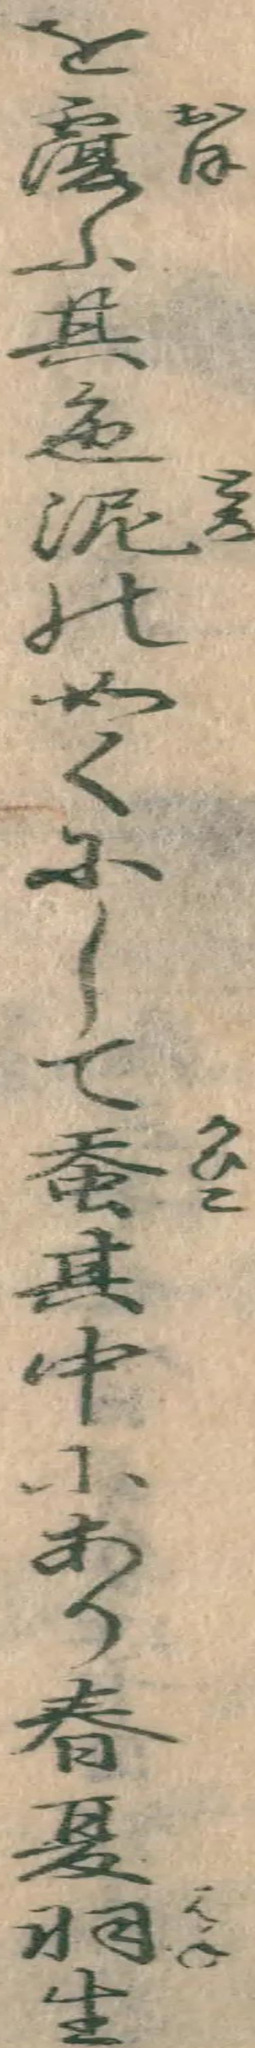を覆ふ其色泥の如くにして蚕其中にあり春夏羽生
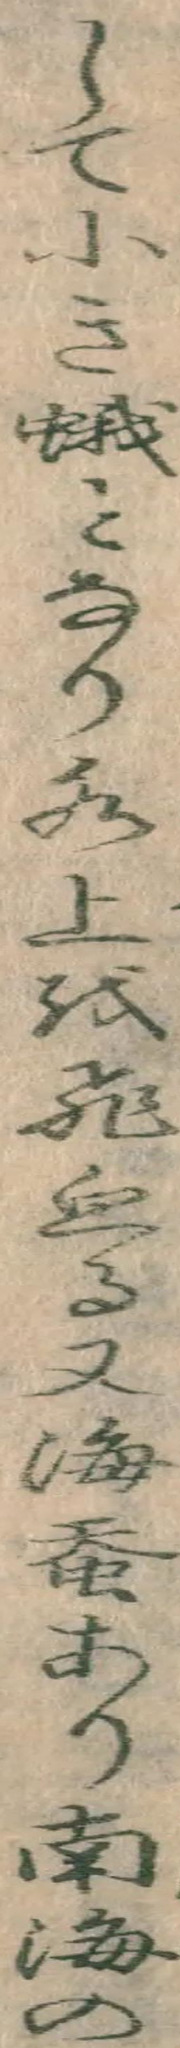して小き蛾となり水上を飛廻る又海蚕あり南海の
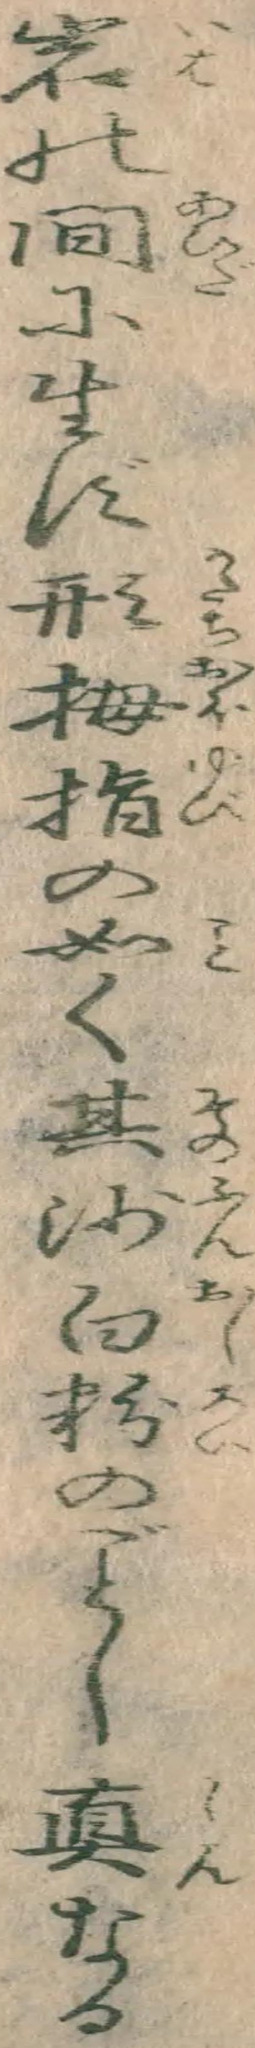岩の間に生ず形拇指の如く其沙白粉のごとし真なる
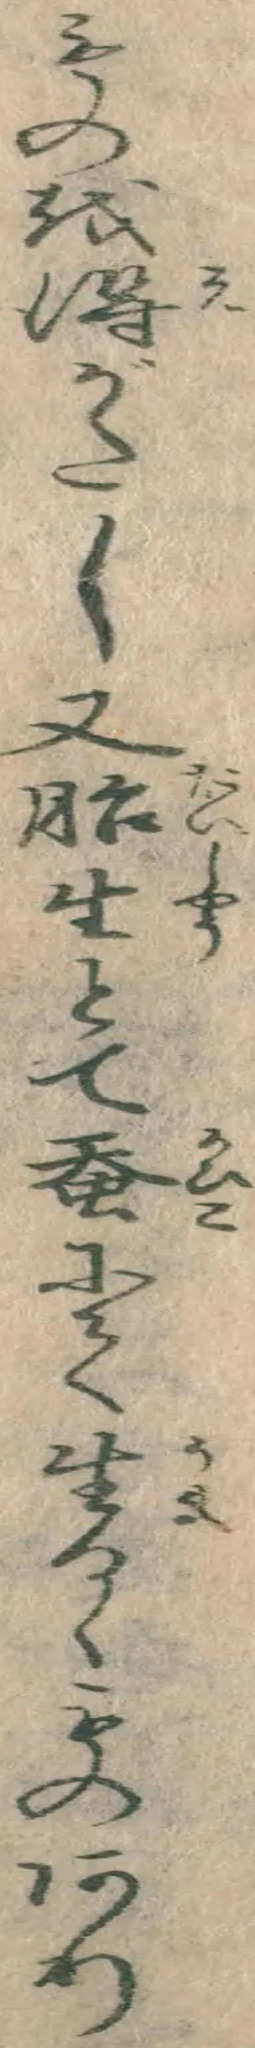ものを得がたし又胎生とて蚕にて生るゝものあり
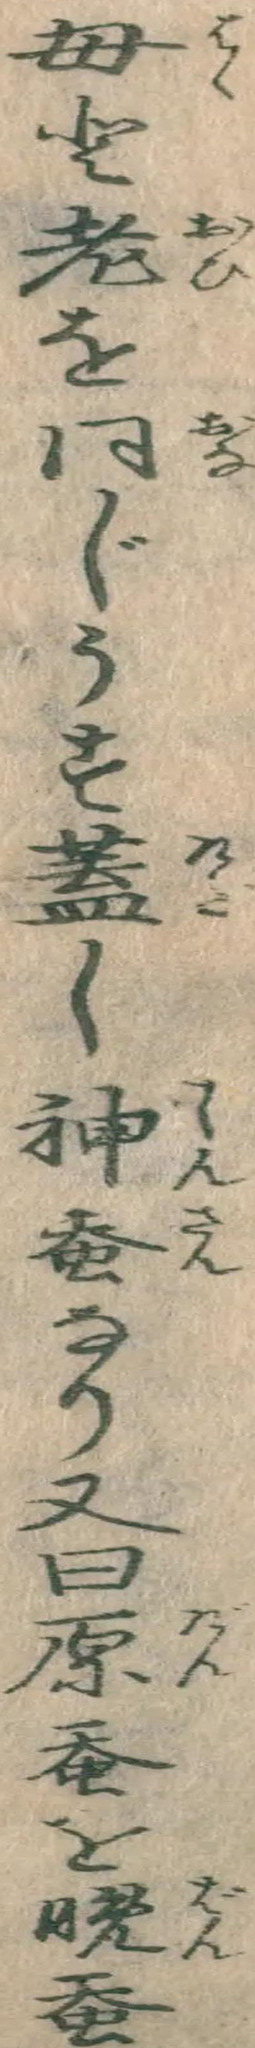母と老を同じうす蓋し神蚕なり又曰原蚕を晩蚕
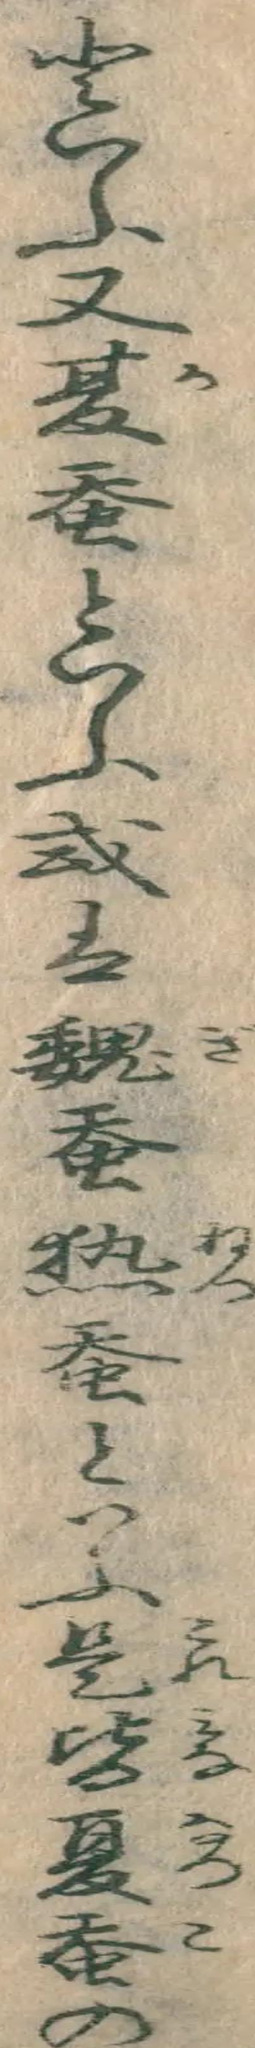といふ又夏蚕といふ或は魏蚕熱蚕といふ是皆夏蚕の
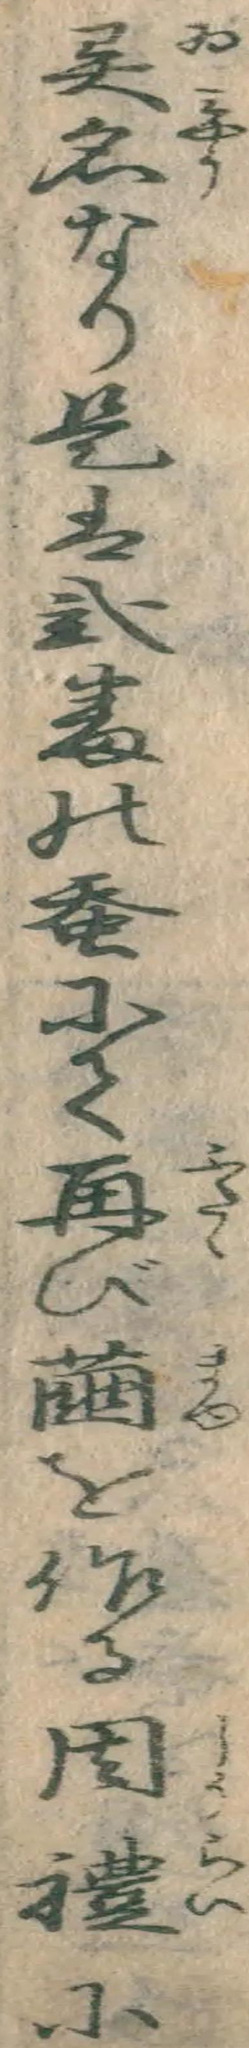異名なり是は弐番の蚕にて再び繭を作る周礼に

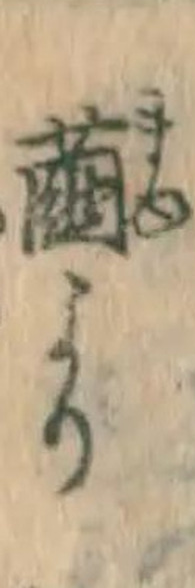繭より
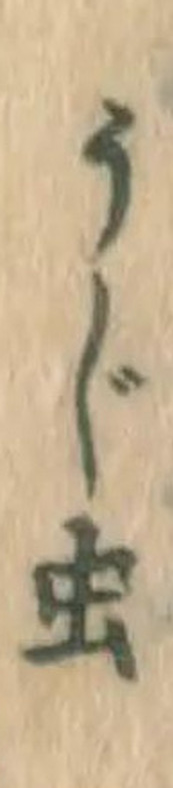うじ虫
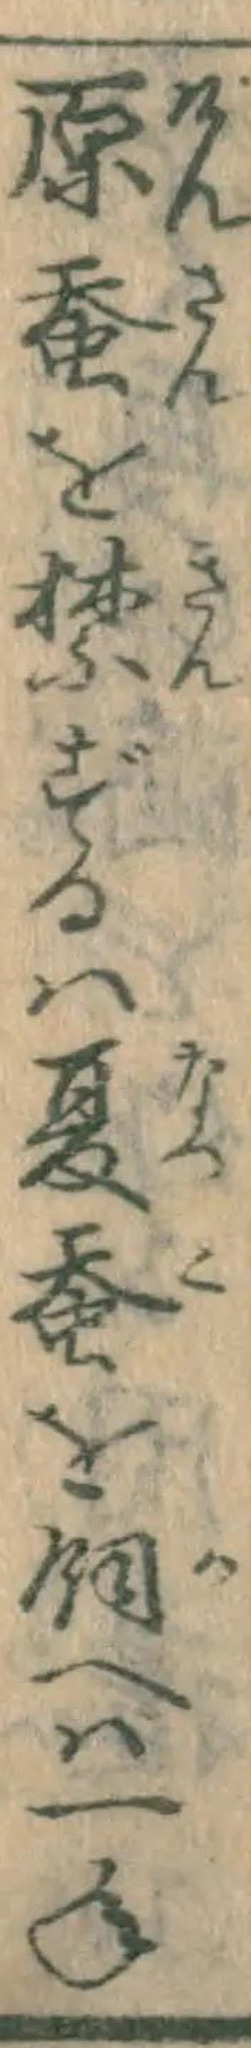原蚕を禁ずるは夏蚕を飼へは一年
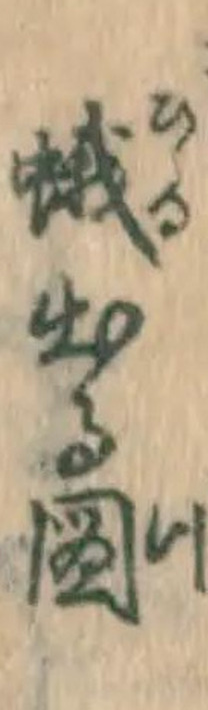蛾出る図
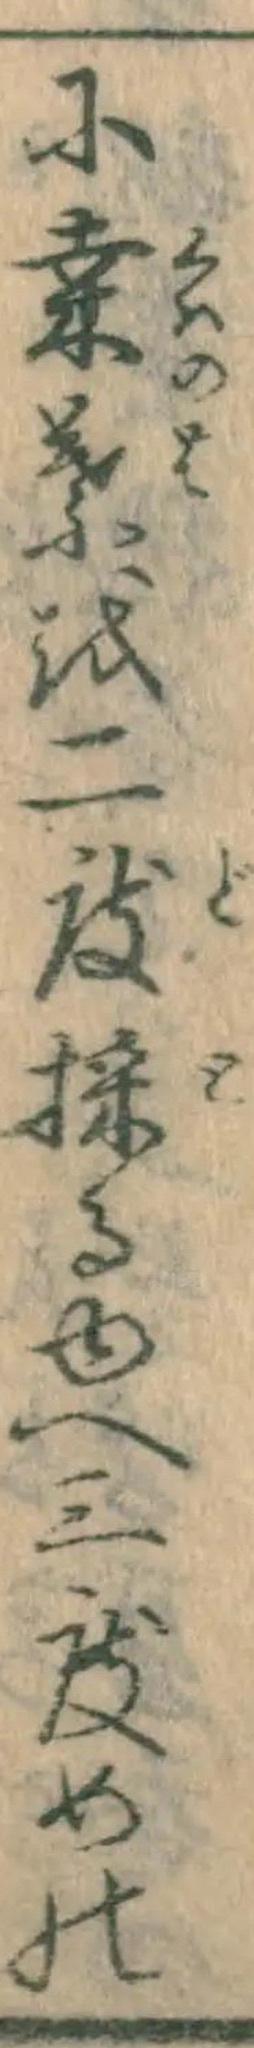に桑葉を二度採るゆへ三度めの
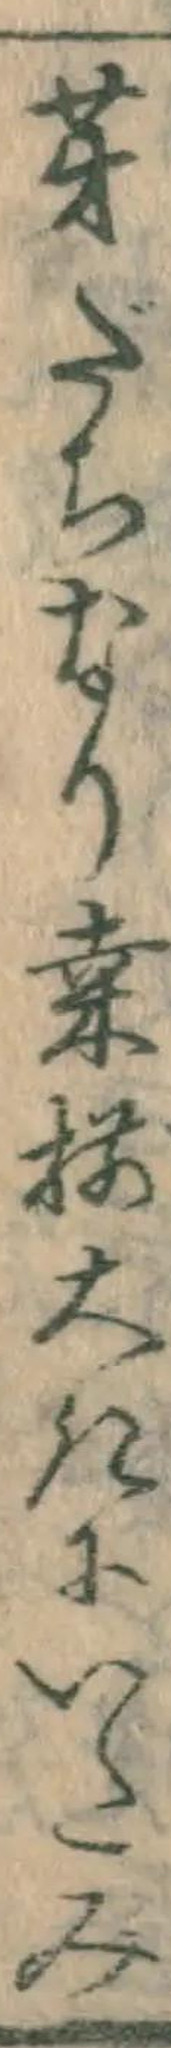芽だちなり桑揃大きにいたみ
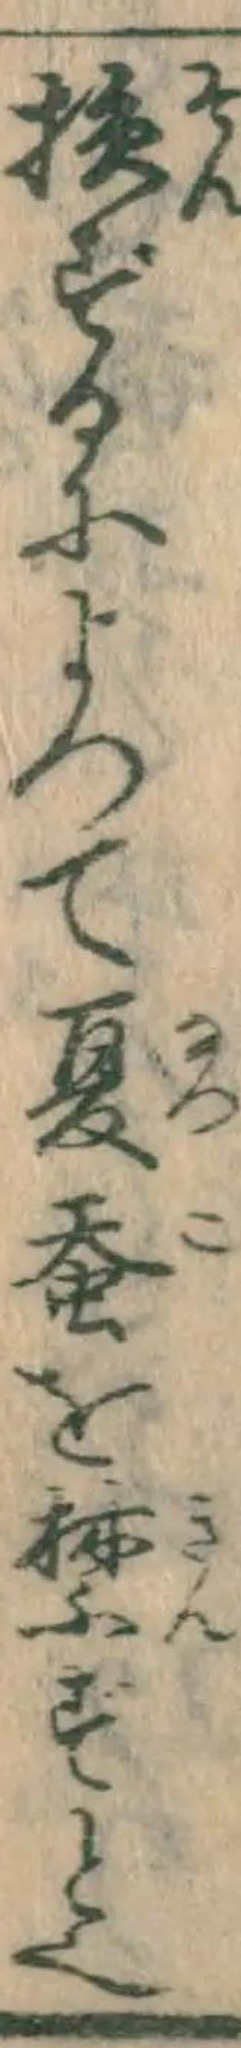損ずるによつて夏蚕を禁ずと也
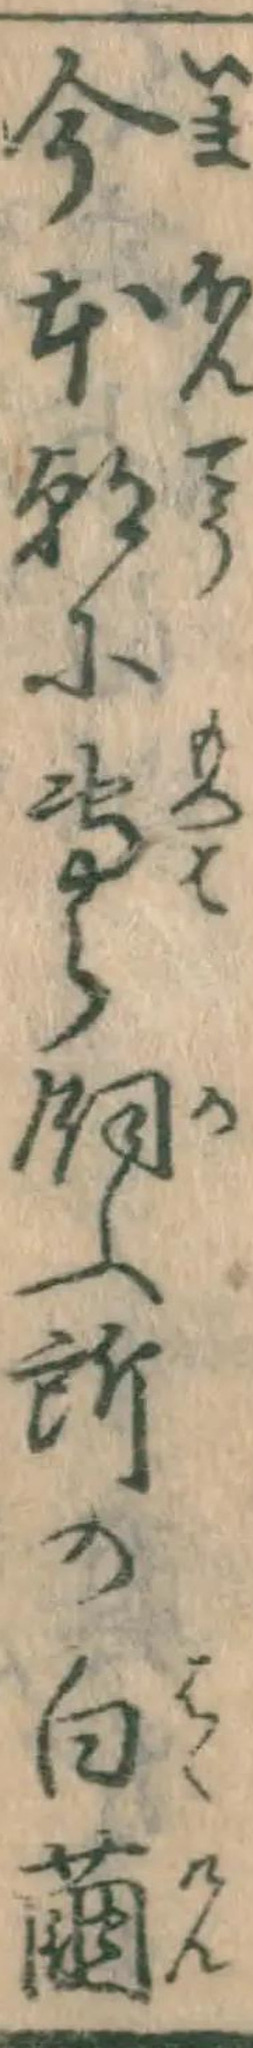今本朝に専ら飼ふ所の白繭
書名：養蚕秘録 3巻. [1]
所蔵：国立国会図書館 National Diet Library, JAPAN
